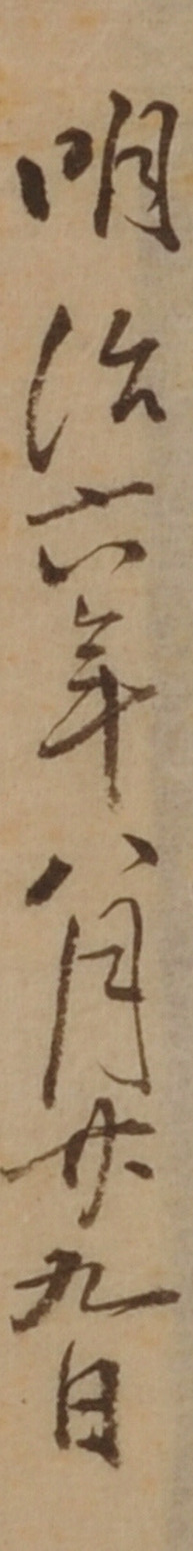明治六年八月廿九日
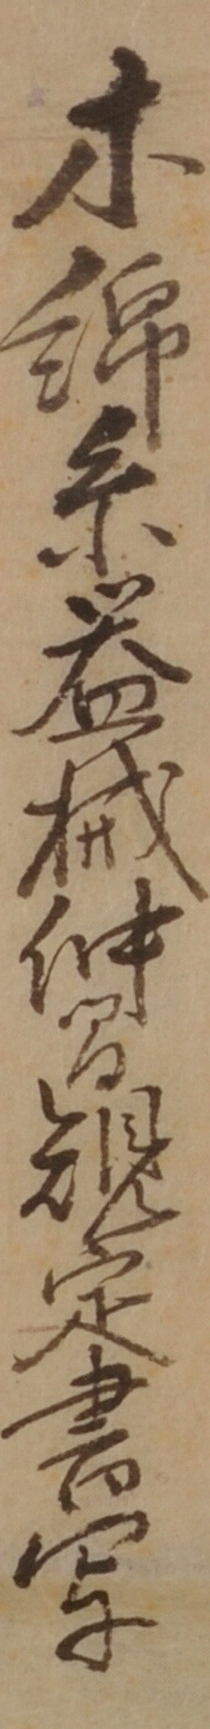木綿糸器械仲間規定書写
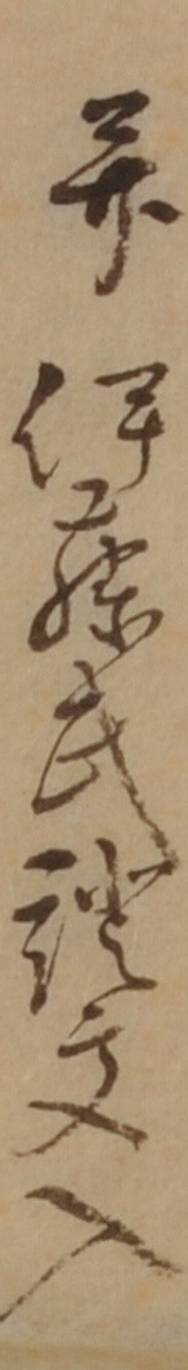并伊藤氏証文入
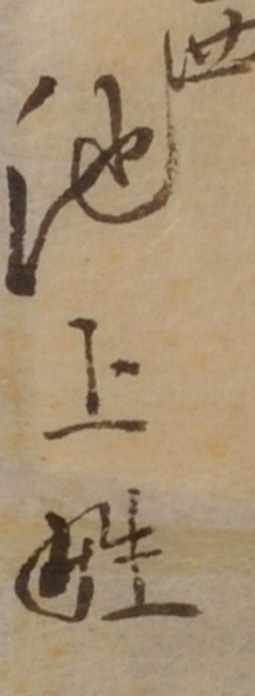池上姓

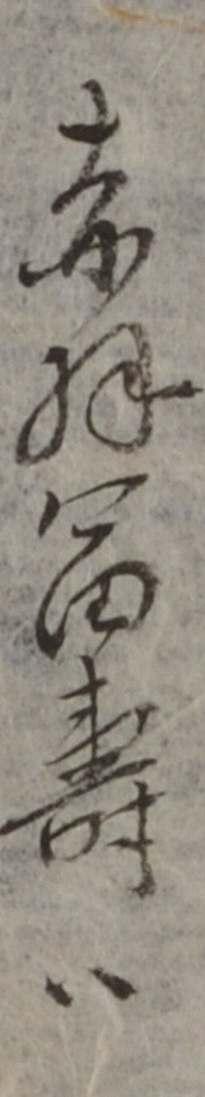赤羽冨寿〃
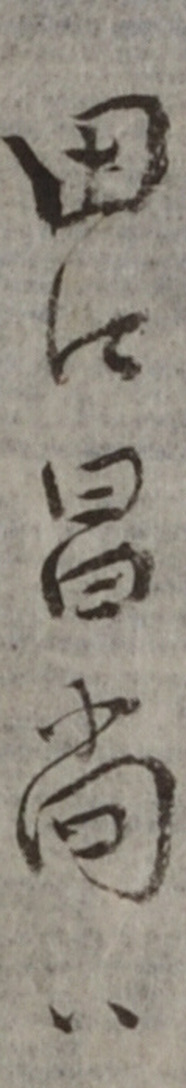田口昌尚〃
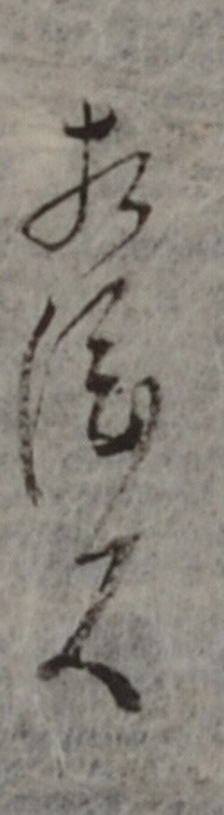相渡ス
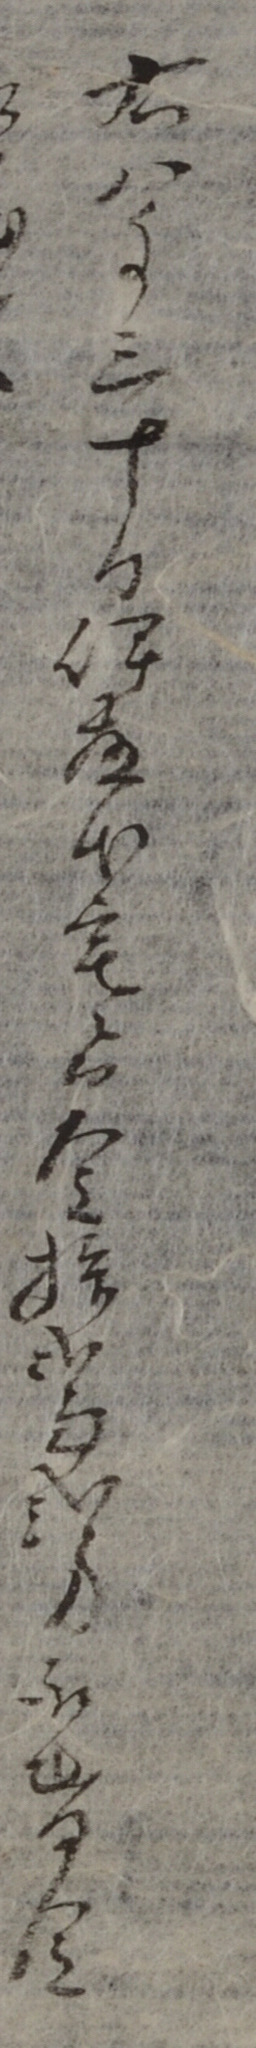右八月三十日伊藤本宅ニ而金拾弐両弐分取替金

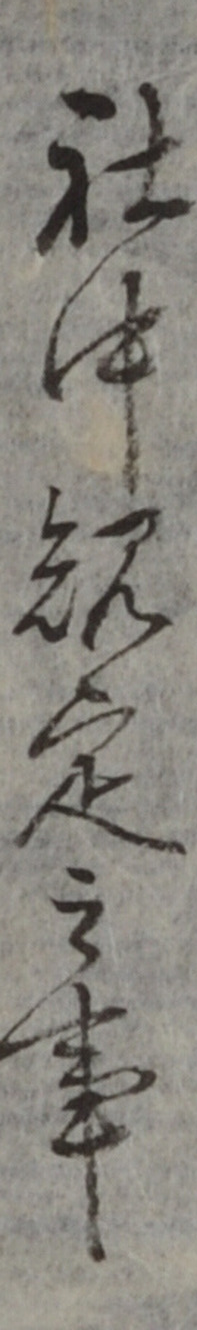社中規定之事
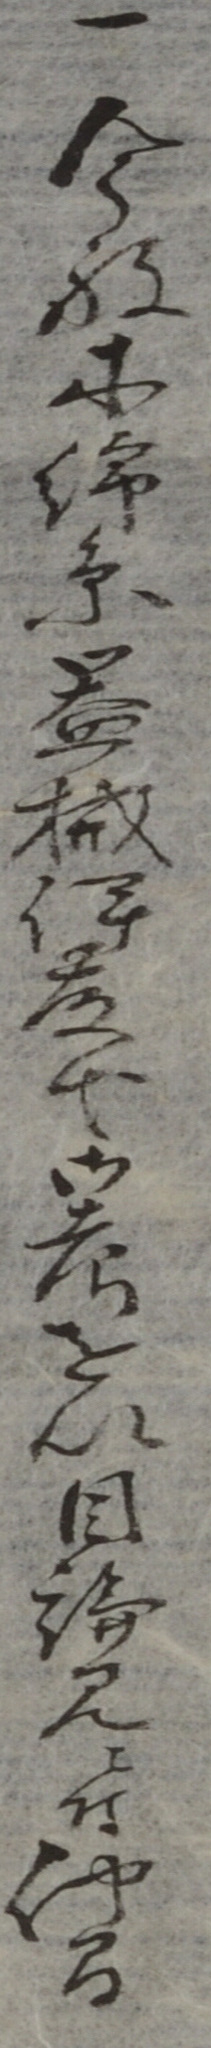一今般木綿糸器械伊藤氏御考を以目論見ニ付仲間
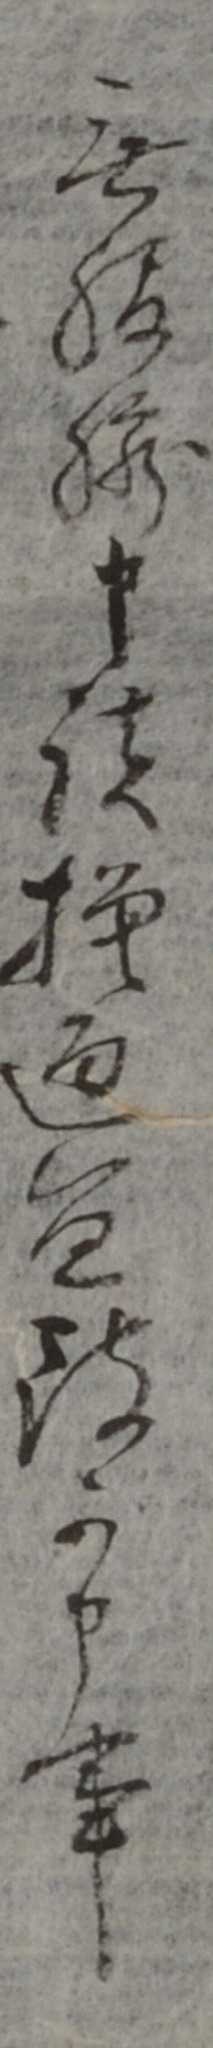無腹蔵申談通致可申事
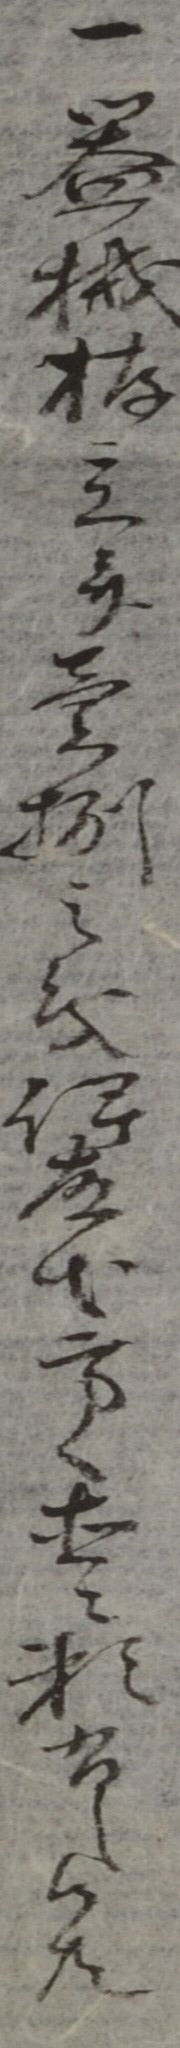一器械拵立并売捌之義伊藤氏方へ直ニ頼有之候共
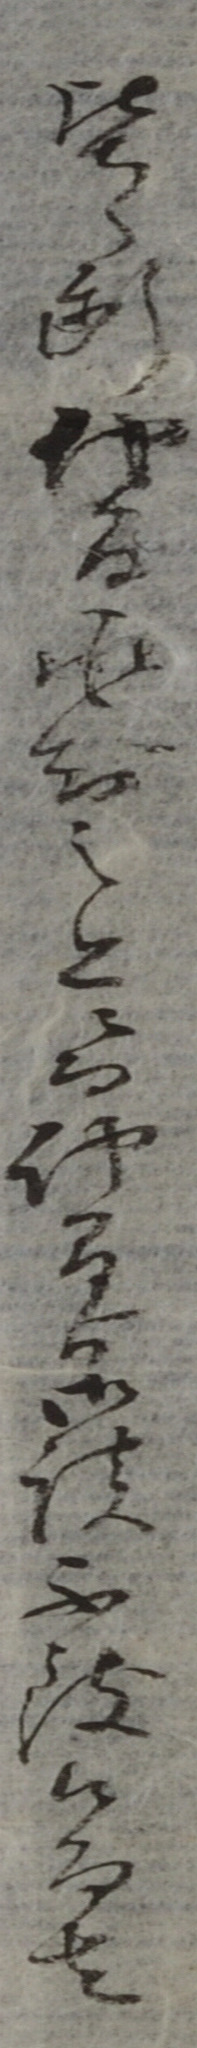皆々断仲間承知之上ニ而仲間ゟ御談不致候而は
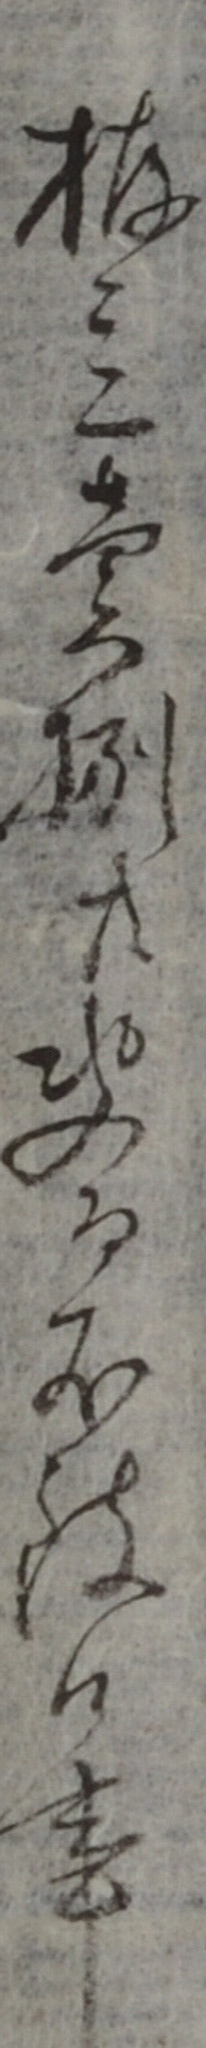拵立売捌共決而不致候事
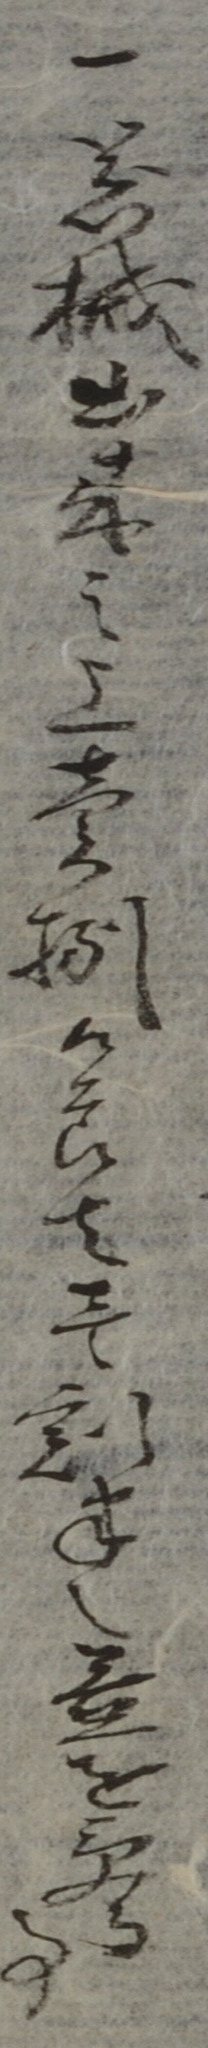一器械出来之上売捌候節は壱割半之益を受る事
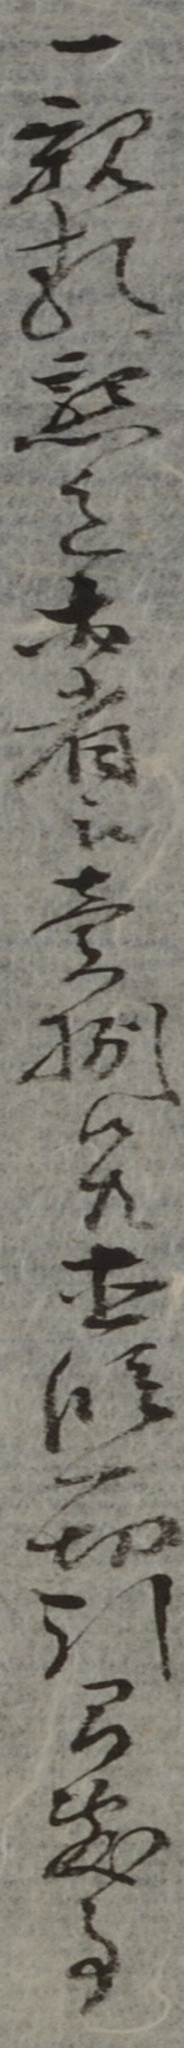一親類熟意等者江売捌候共直段一切引間敷事
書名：木綿糸器械仲間規定書（写）
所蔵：伊那市立高遠町図書館・合同会社AMANE
